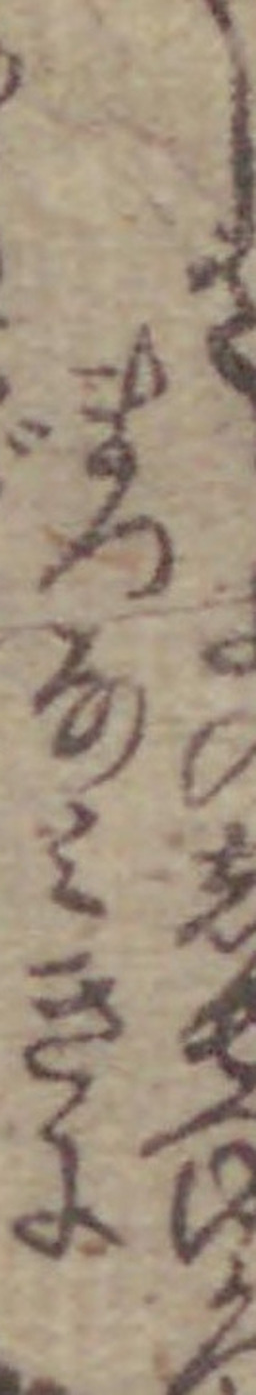まつなみきに
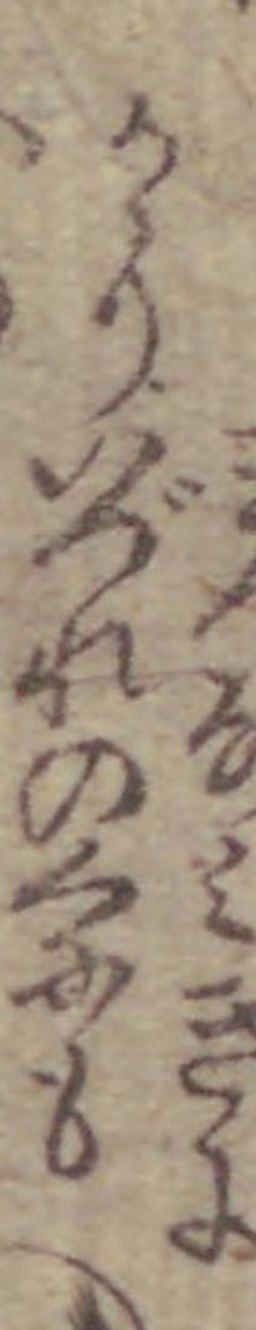かゝりいづれのくにも
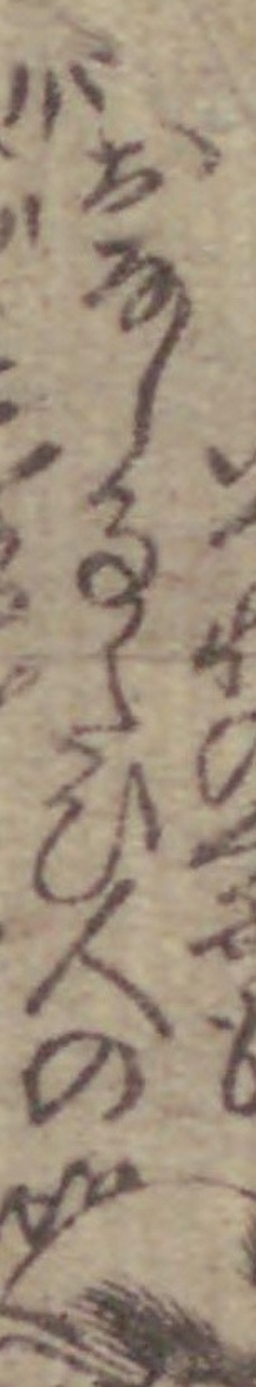おなし事たひ人の
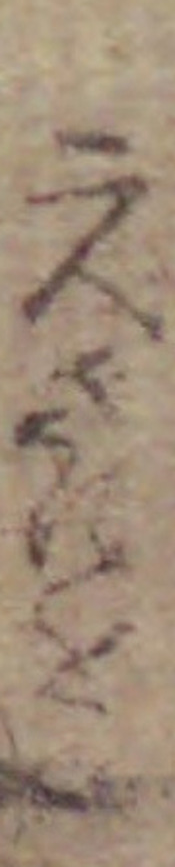二人さすを
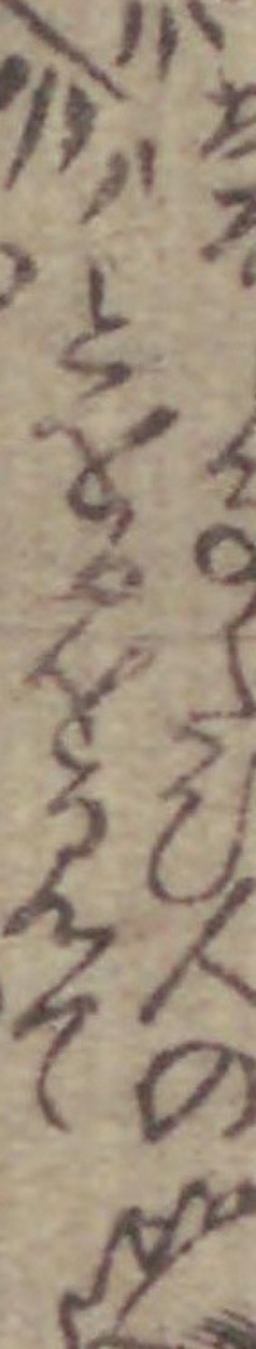とをるを見て
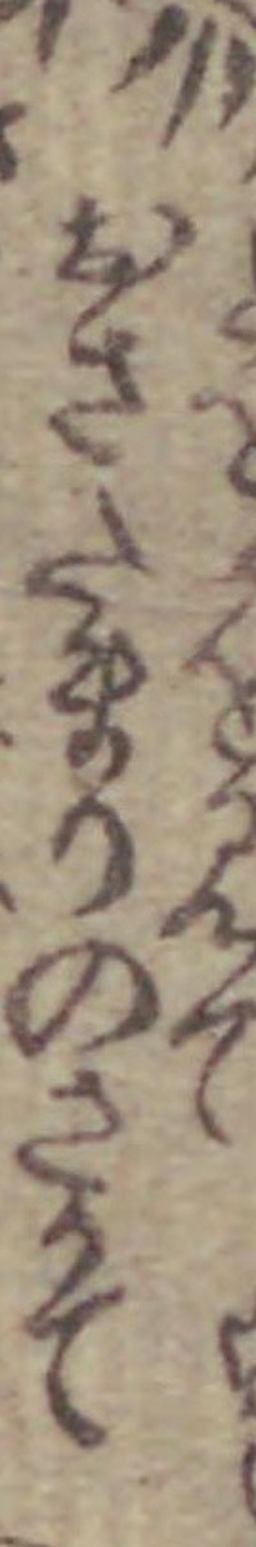おさたまりのさかて
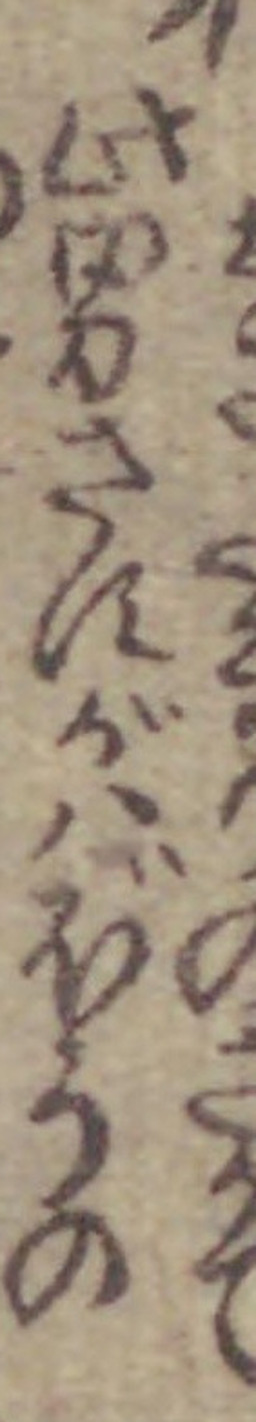此男さすがはぼうの
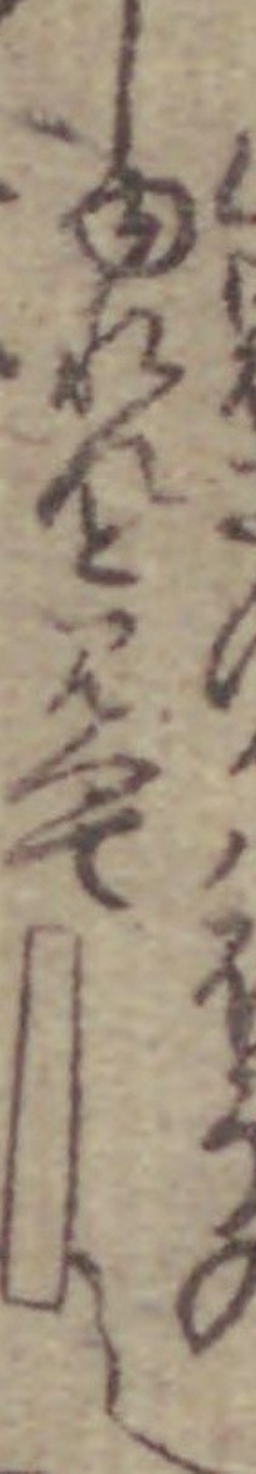しゆれんと見へて
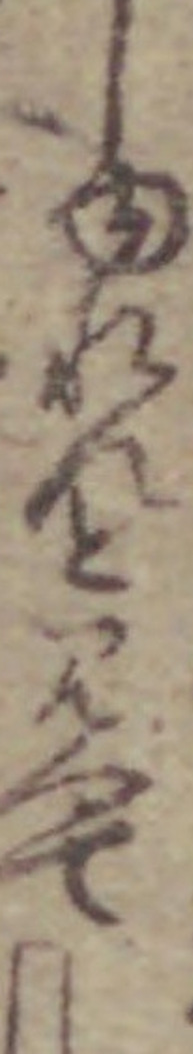しゆれんと見へて
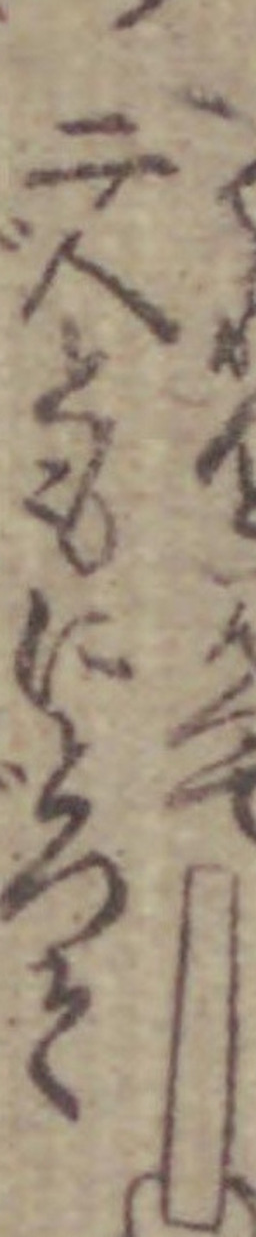二人ともにとつて
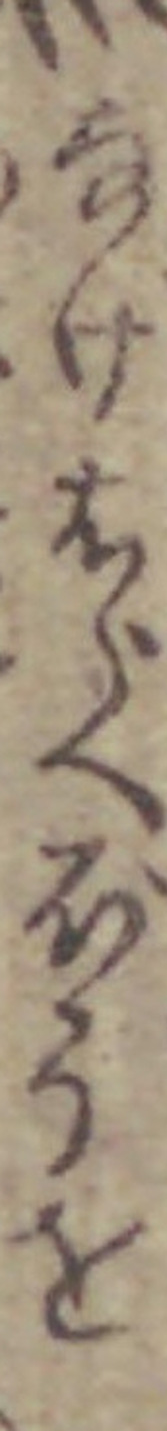なげはらへぼうを
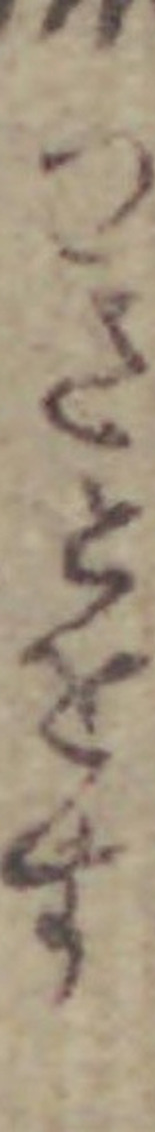つきとをす
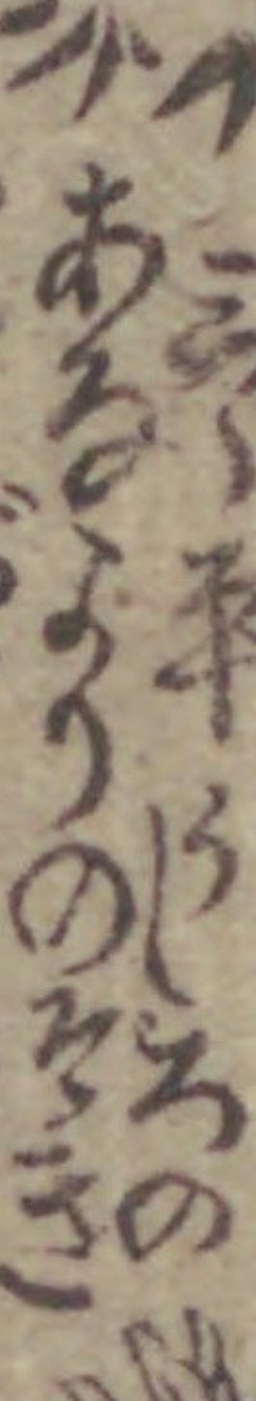あなよりのぞき
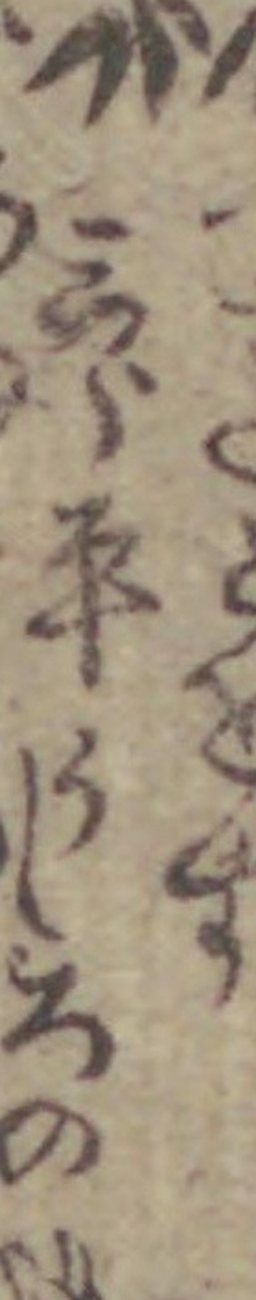三郎平うしろの
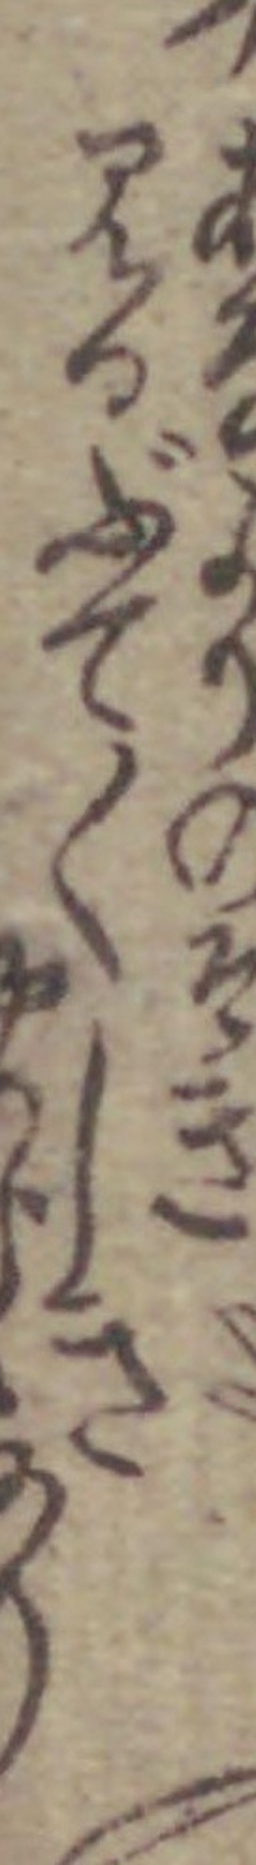見るぶて〳〵しき
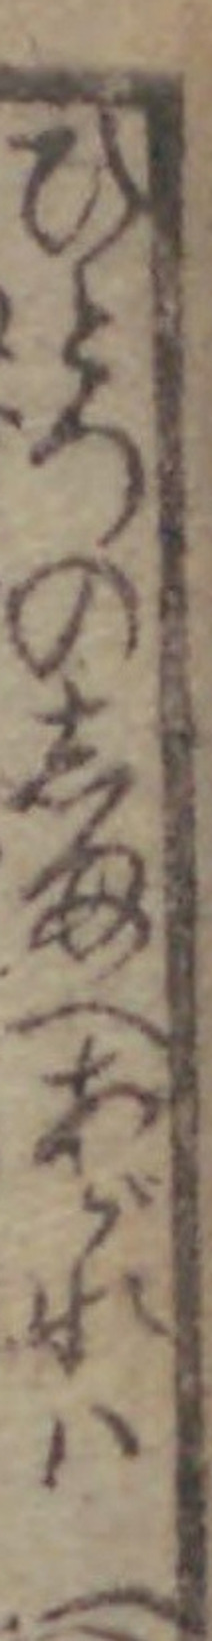ひとつのしまへあがれは
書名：近頃嶋めぐり 3巻
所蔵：国立国会図書館 National Diet Library, JAPAN
